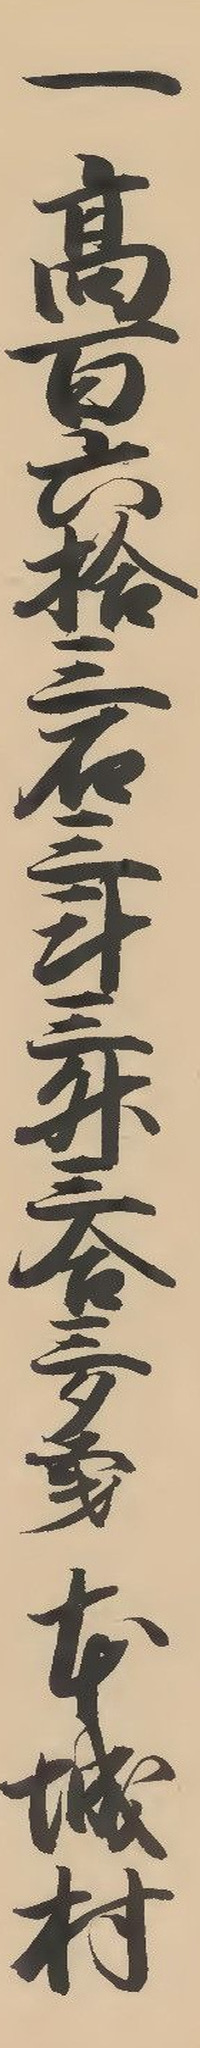一高百六拾三石三斗三升三合三勺五才本城村
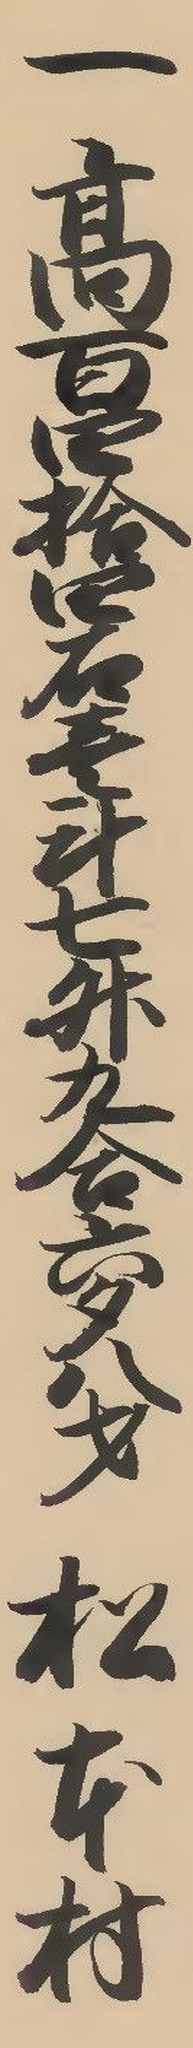一高百四拾四石壱斗七升九合六勺八才松本村

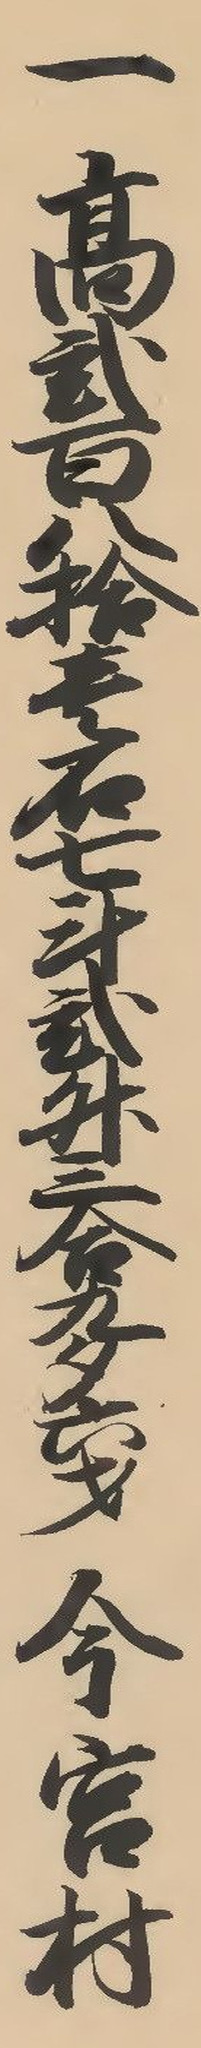一高弐百八拾壱石七斗弐升三合九勺六才今宮村
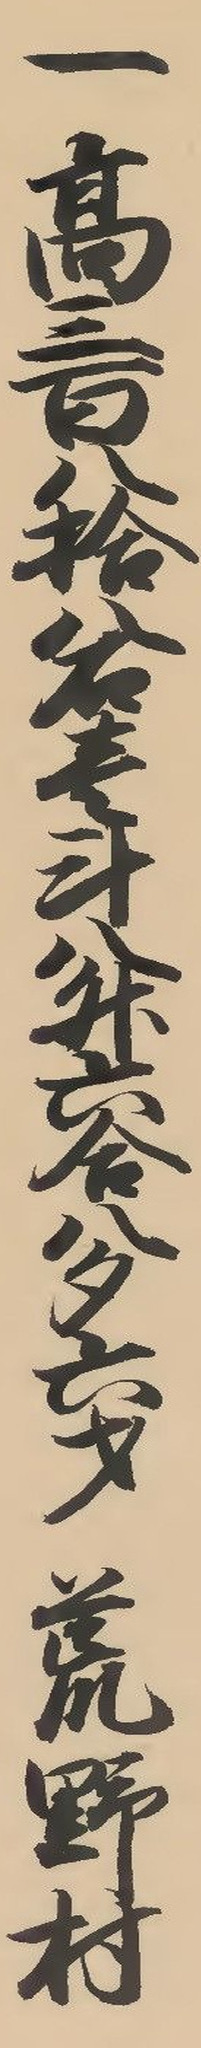一高三百八拾八石壱斗八升六合八勺六才荒野村
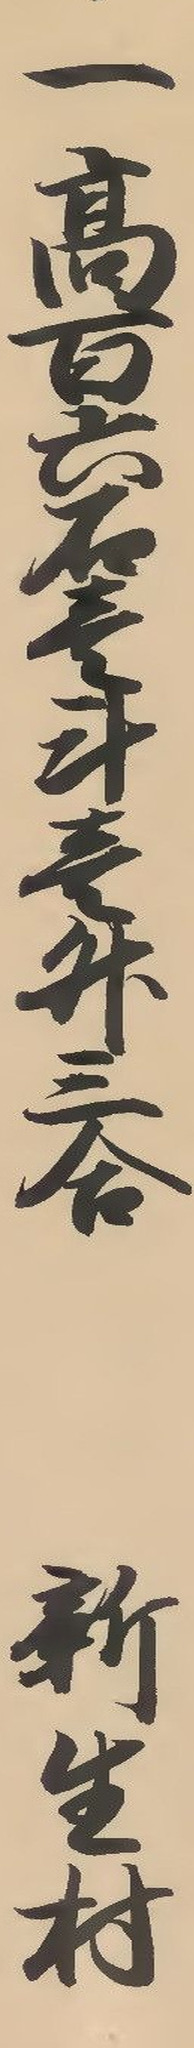一高百六石壱斗壱升三合新生村
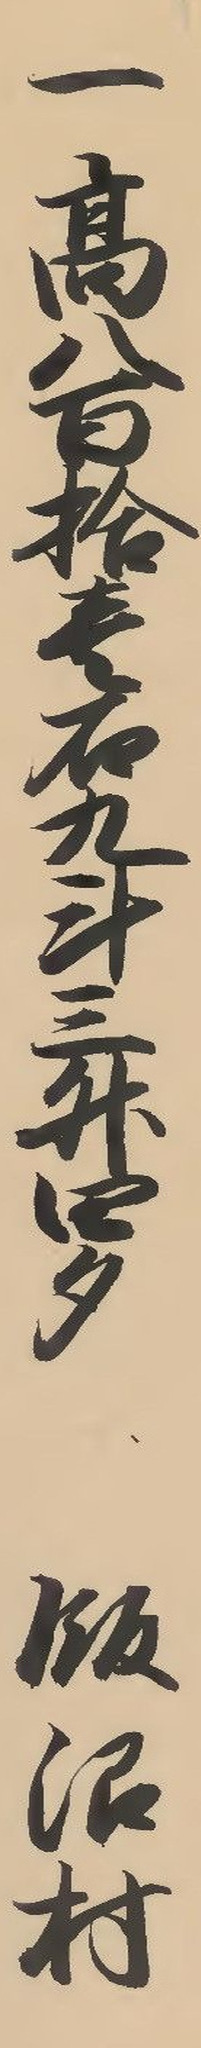一高八百拾壱石九斗三升四勺飯沼村
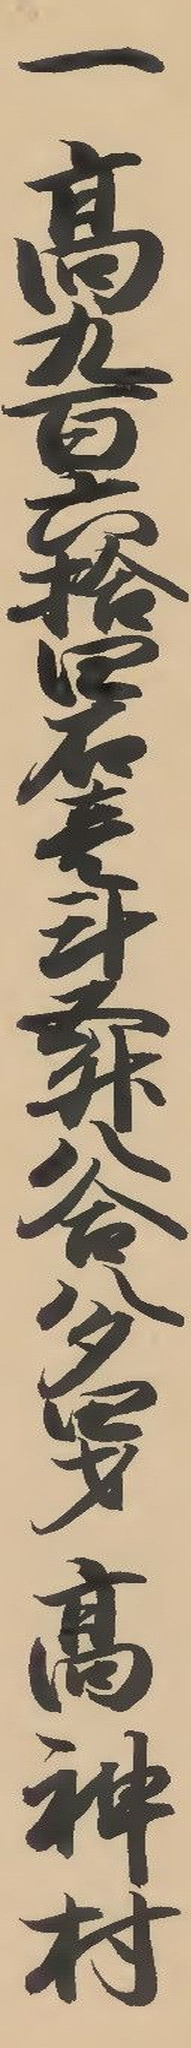一高九百六拾四石壱斗五升八合八勺四才高神村
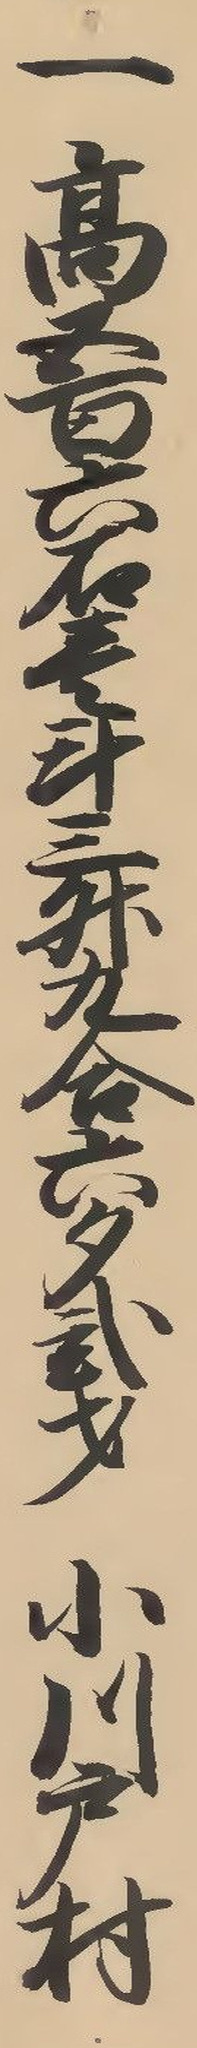一高五百六石壱斗三升九合六勺弐才小川戸村
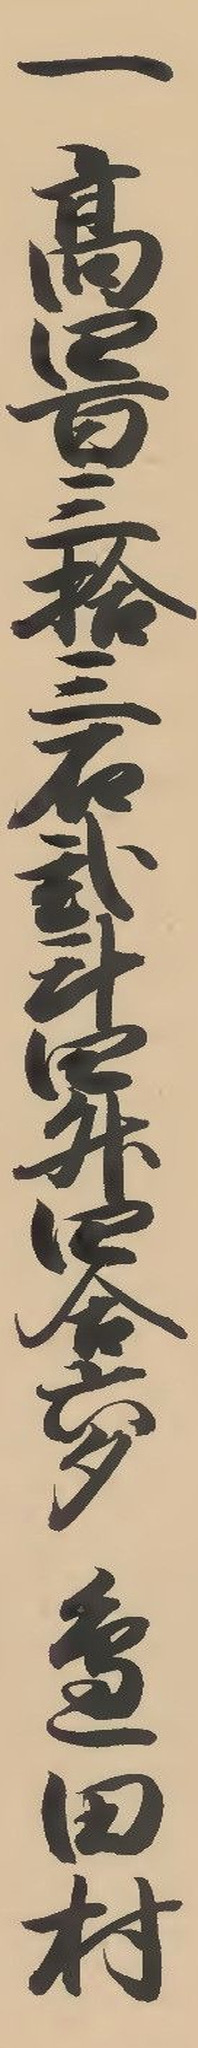一高四百三拾三石弐斗四升四合六勺辺田村
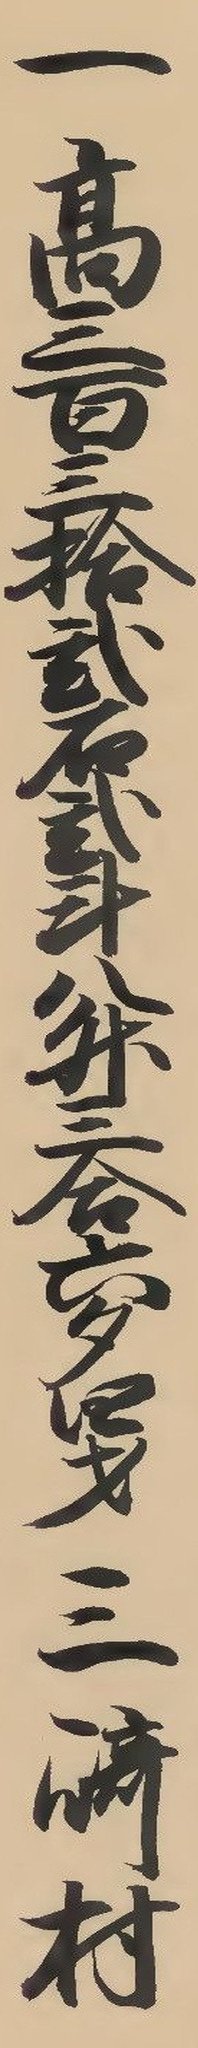一高三百三拾弐石弐斗八升三合六勺四才三崎村

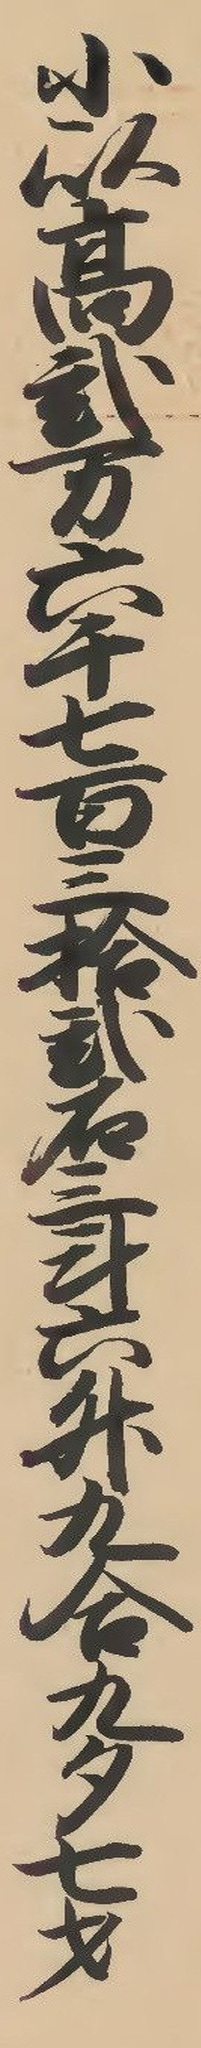小以高弐万六千七百三拾弐石三斗六升九合九勺七才
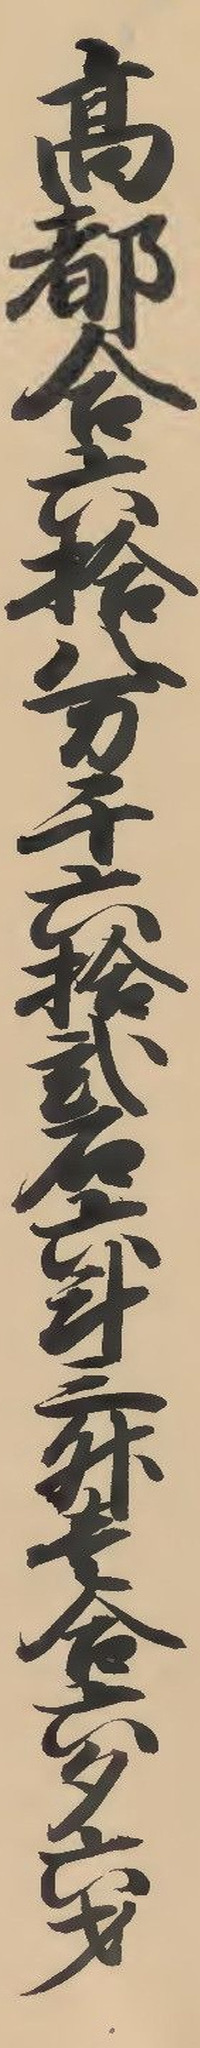高都合六拾八万千六拾弐石六斗三升壱合六勺六才
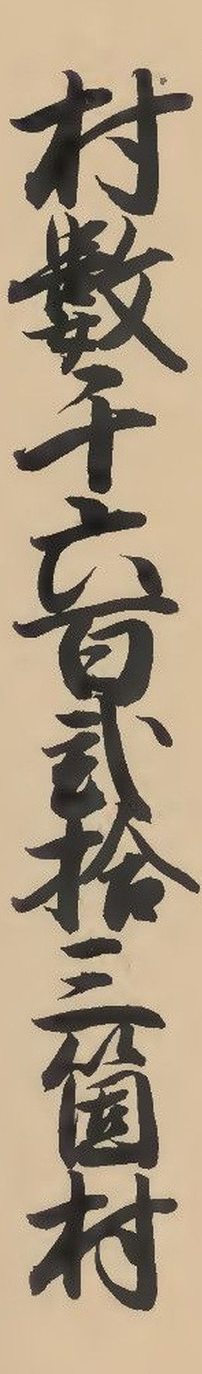村数千六百弐拾三箇村
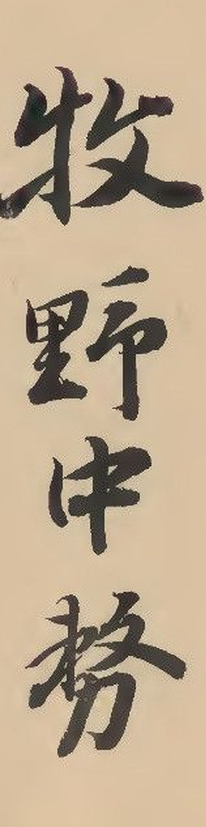牧野中務
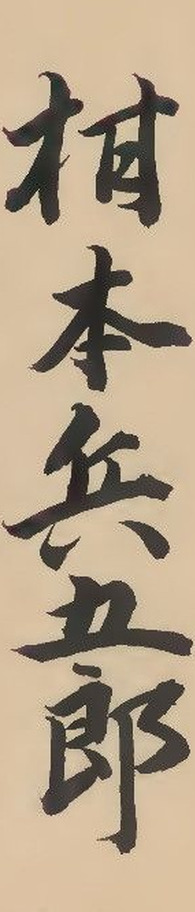柑本兵五郎
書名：下総国郷帳
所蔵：国立公文書館 National Archives of Japan
